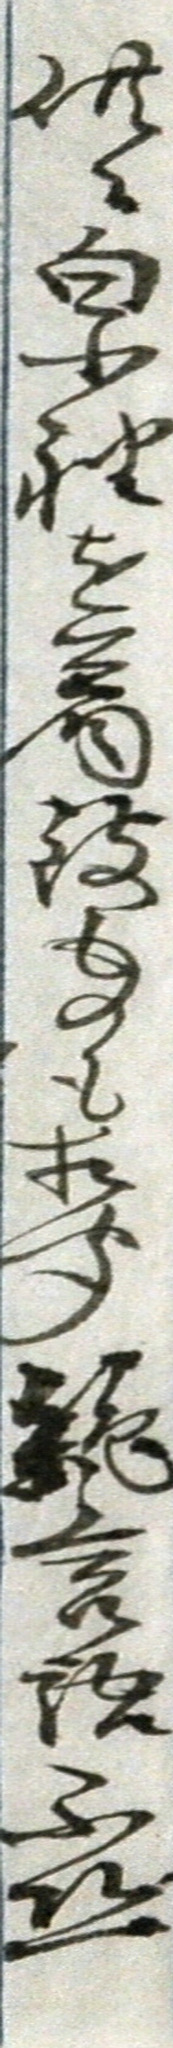供ニ白小袖を着致ものも相聞絶言語不恐
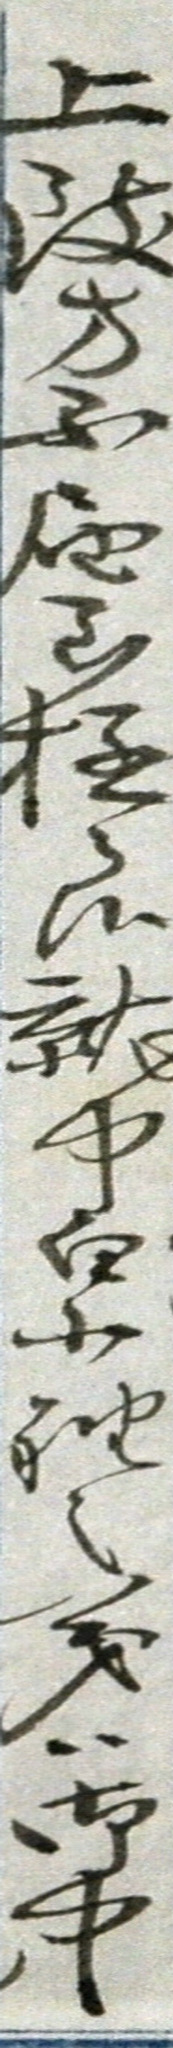上致方不届至極ニ候就中白小袖之義ハ御中
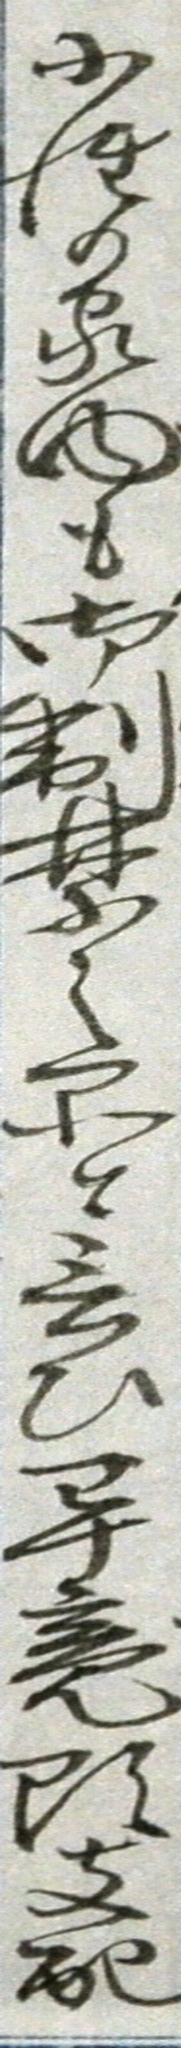小性の家内も御制禁之品と云ひ畢竟頭支配
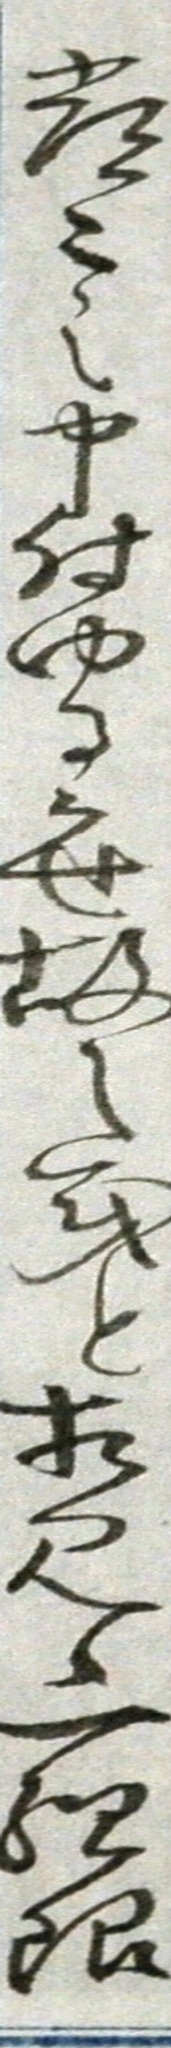常々之申付ゆるヶせ故之義と相見候一組限
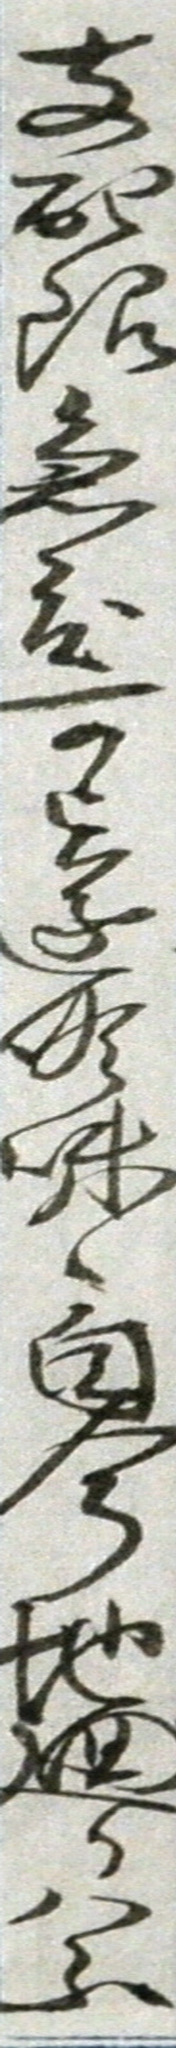支配限急度可被遂吟味候自今地廻りハ不
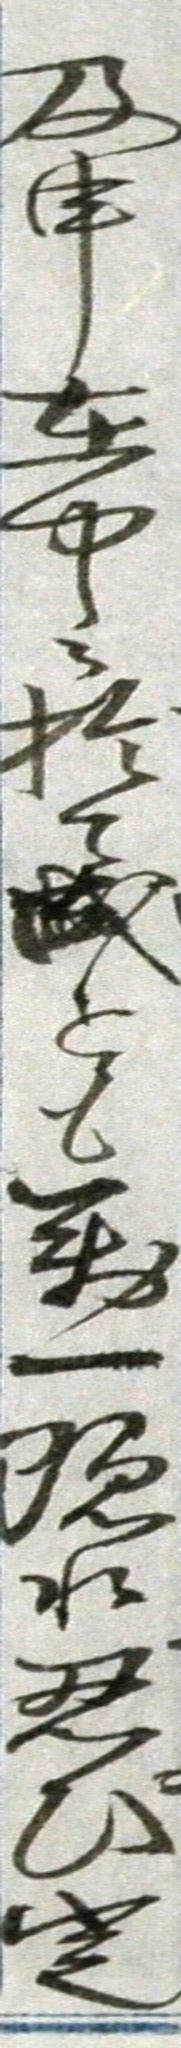及申在中ニ於て成とも万一隠れ忍ひ定
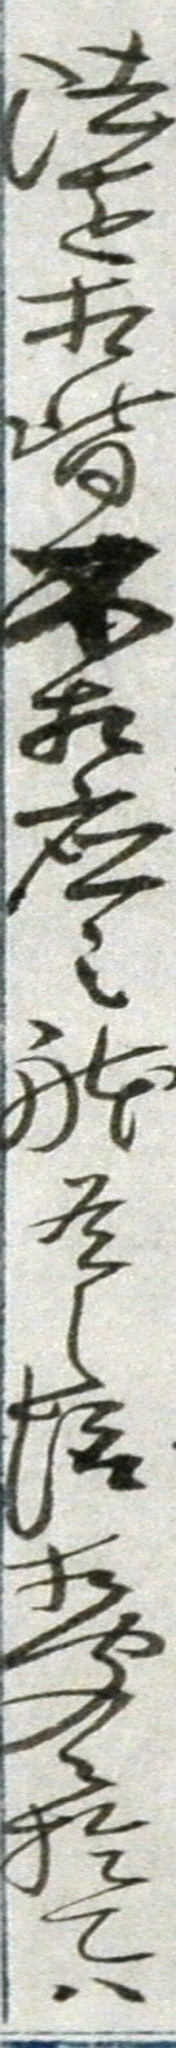法を相背不相応之体有之趣相聞ニ於てハ
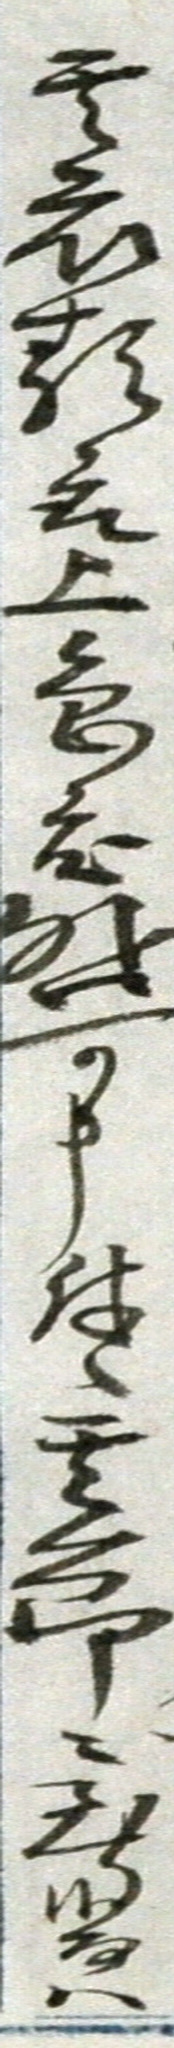其衣類取上急度咎可申付候其節ニ至り候而ハ
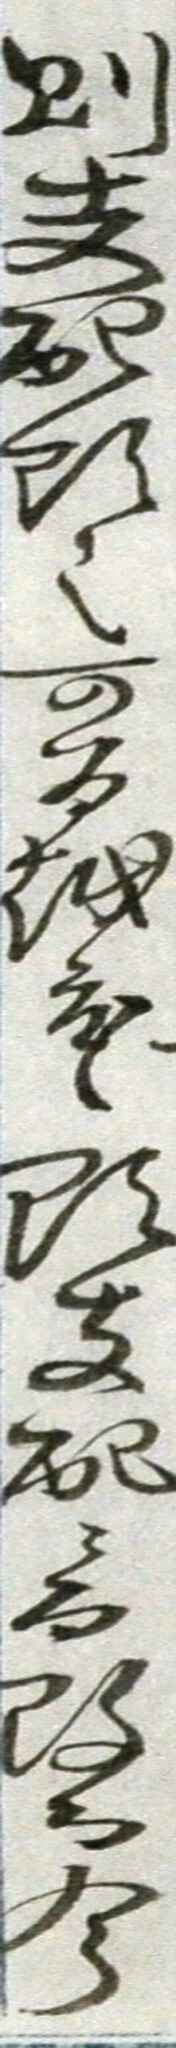則支配頭之可為越度候頭支配ニ而改而今
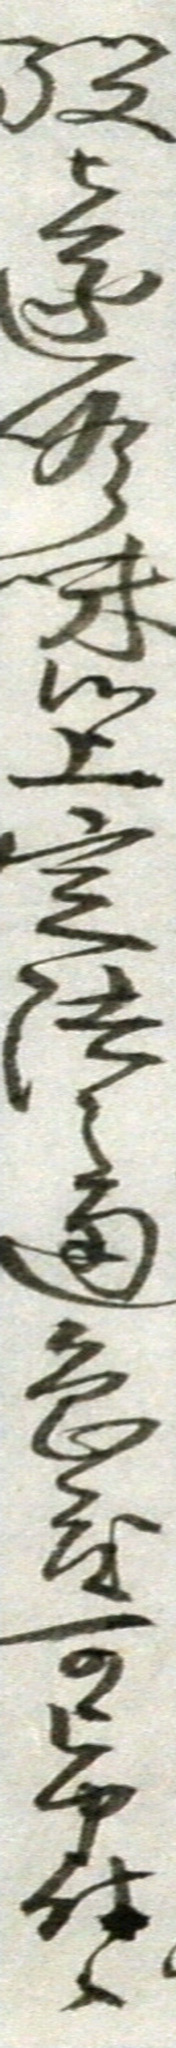般被遂吟味候上定法之通急度可被申付候
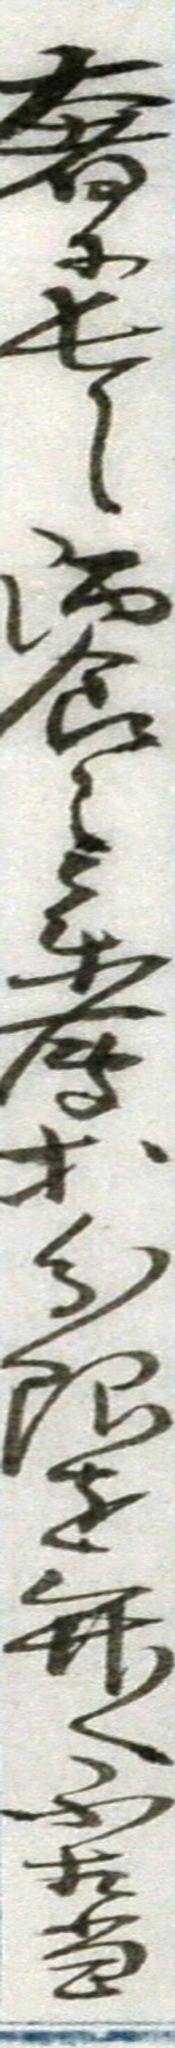奢に長し酒食之参会等分限を弁へ不相当
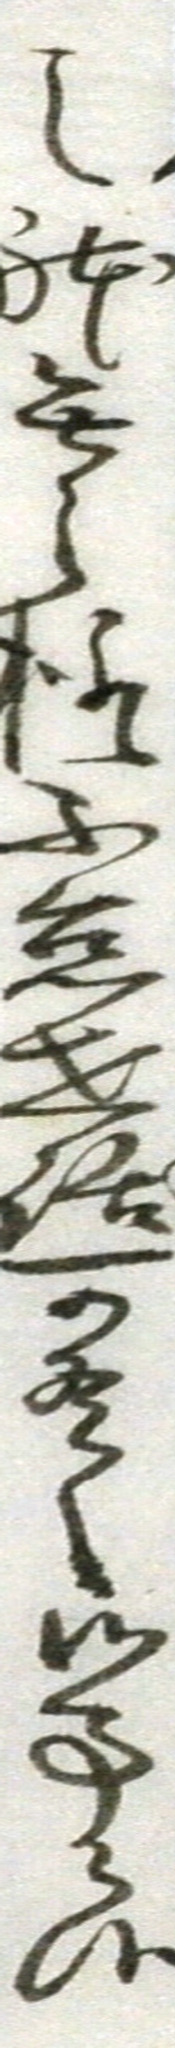之体無之様不怠世話可有之候事ニ候
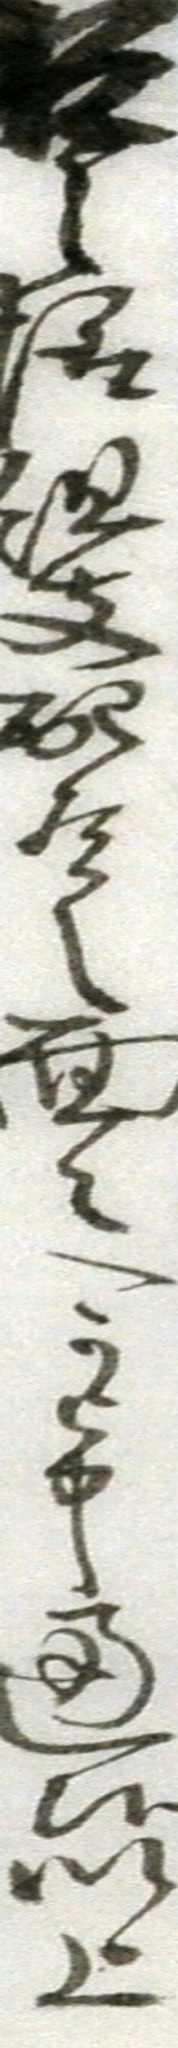右之趣組支配有之面々へ可被申通候以上
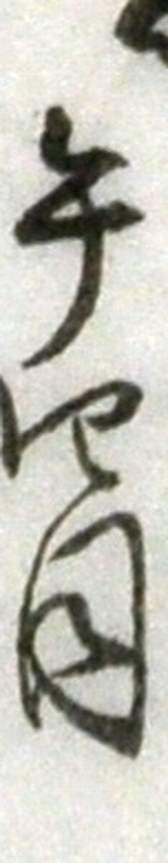午四月
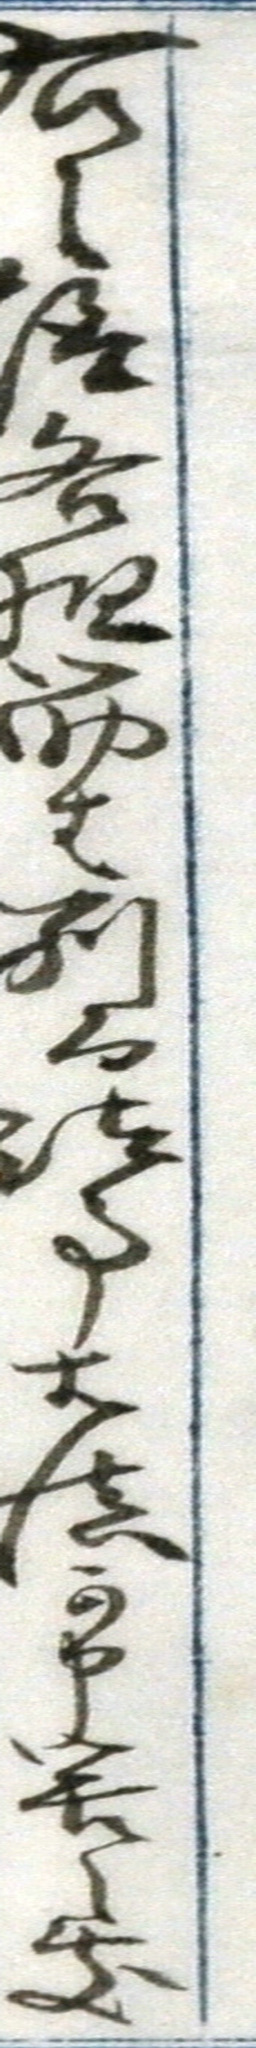右之趣各組筋は別而諸事相慎可申筈之処
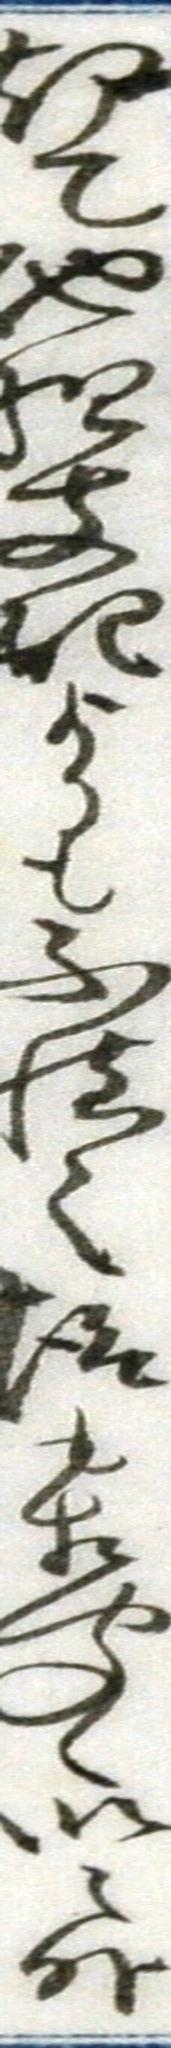却て他組支配よりも不慎之趣も相聞候以之外
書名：長好公御代被仰出御書付（写）
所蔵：伊那市立高遠町図書館・合同会社AMANE
